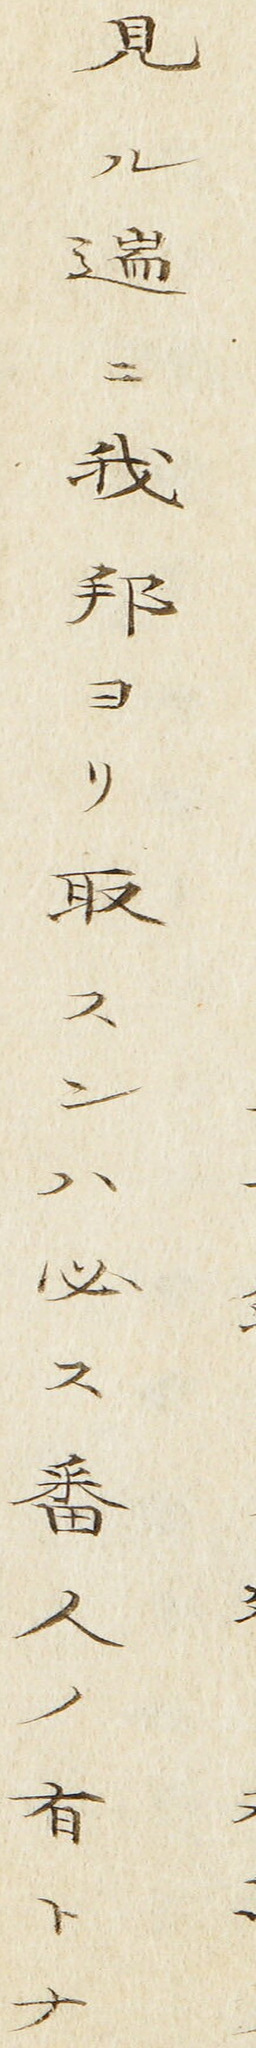見ル遄ニ我邦ヨリ取スンハ必ス番人ノ有トナ
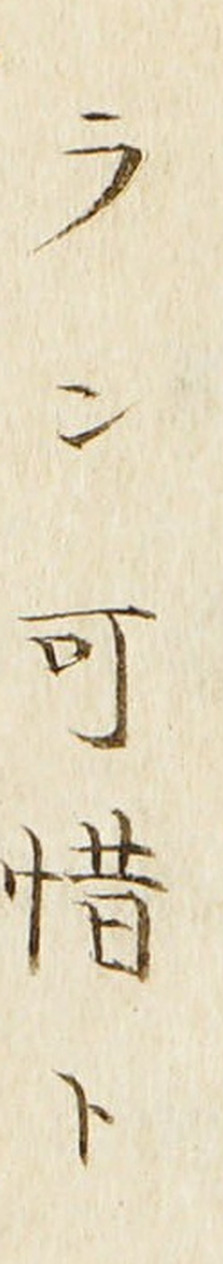ラン可惜ト
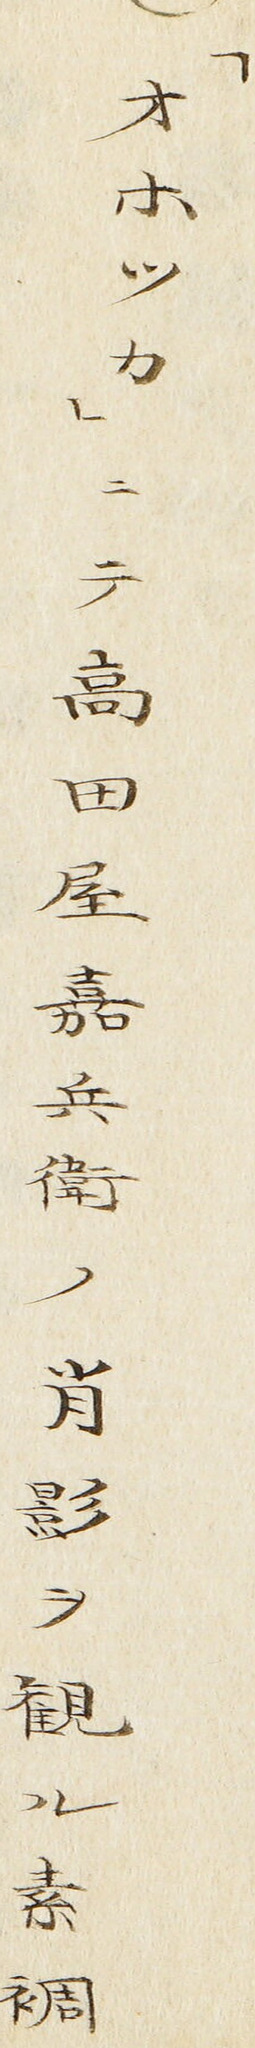〇「オホツカ」ニテ高田屋嘉兵衛ノ肖影ヲ観ル素裯
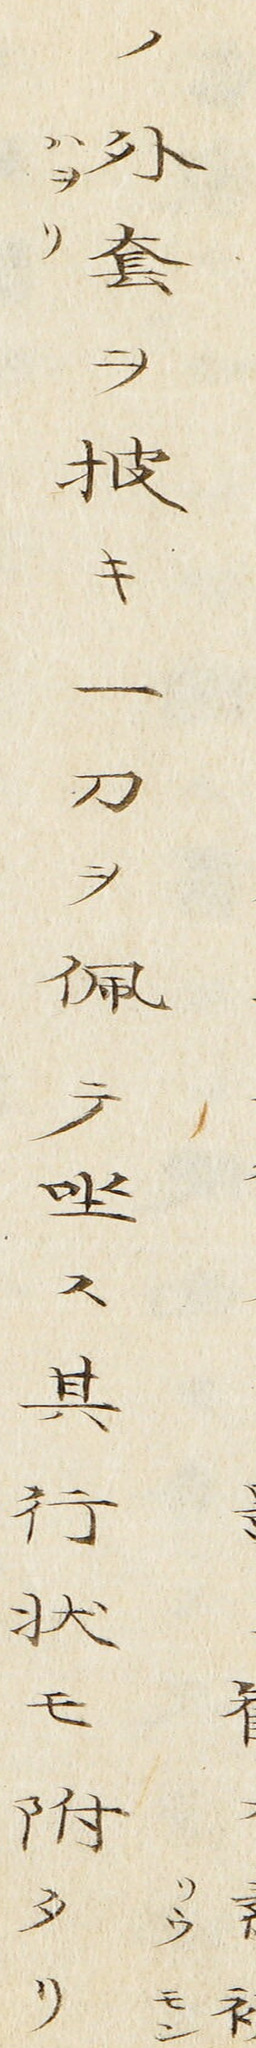ノ外套ヲ披キ一刀ヲ佩テ坐ス其行状モ附タリ
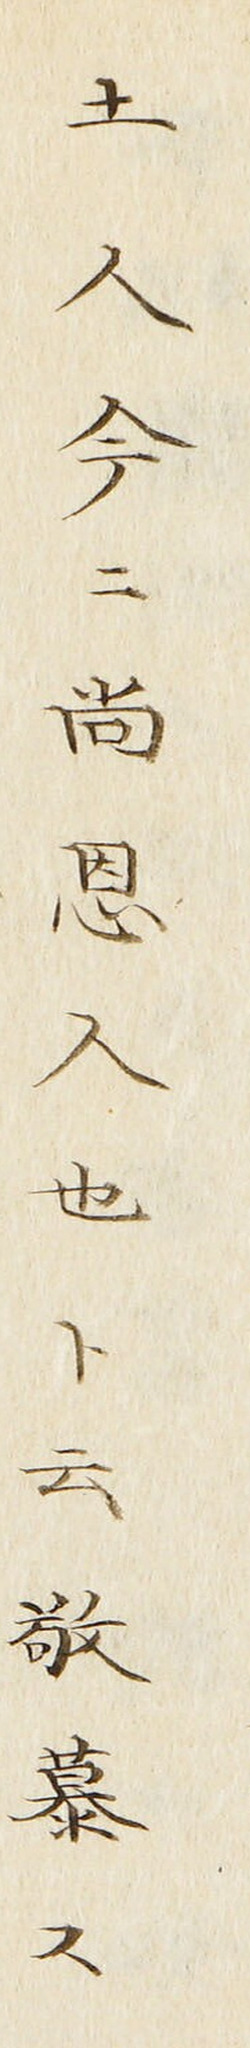土人今二尚恩人也ト云敬慕ス
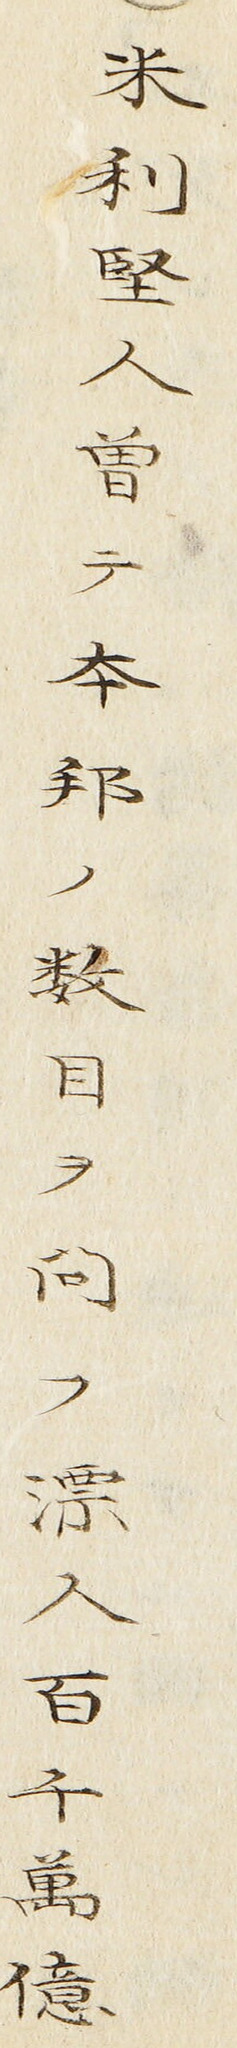〇米利堅人曽テ本邦ノ数目ヲ問フ漂人百千萬億
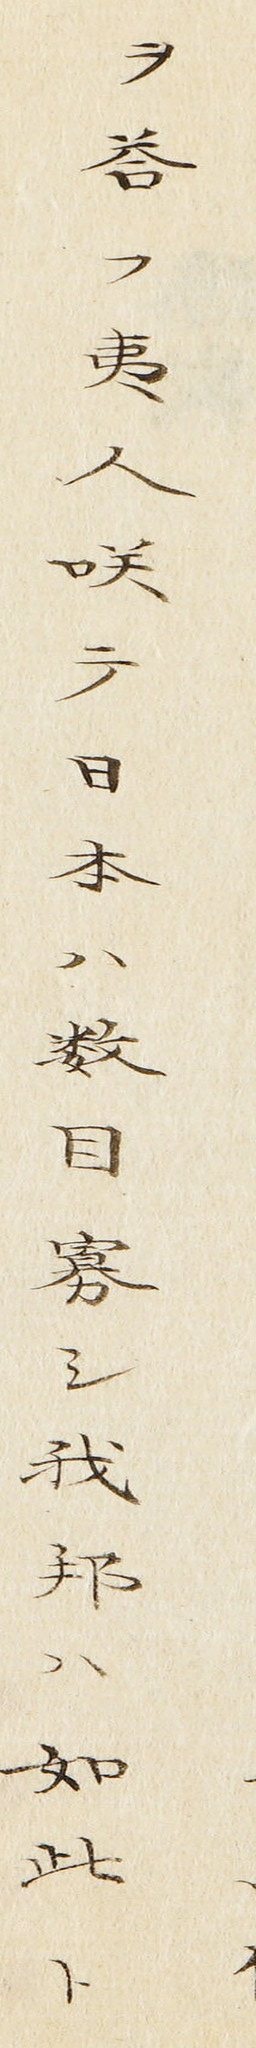ヲ答フ夷人咲テ日本ハ数目寡シ我邦ハ如此ト
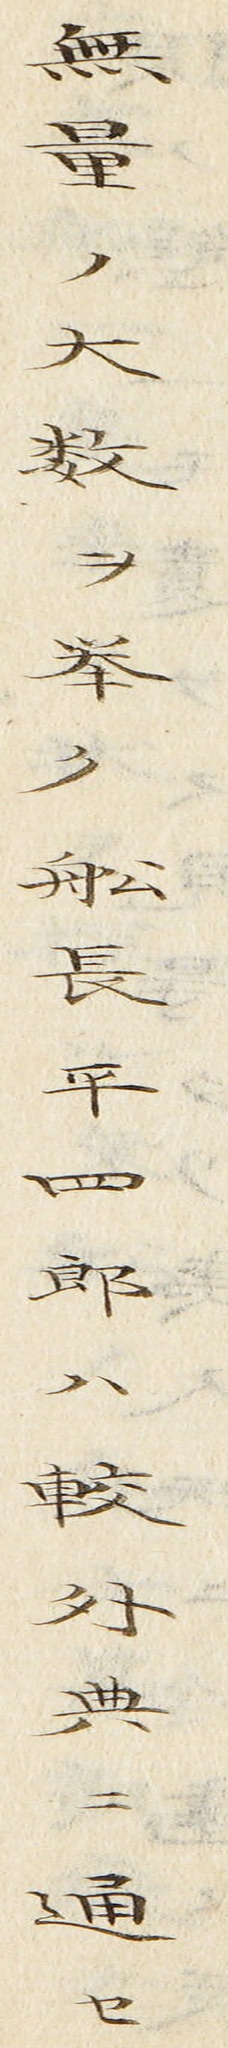無量ノ大数ヲ挙ク舩長平四郎ハ較外典ニ通セ
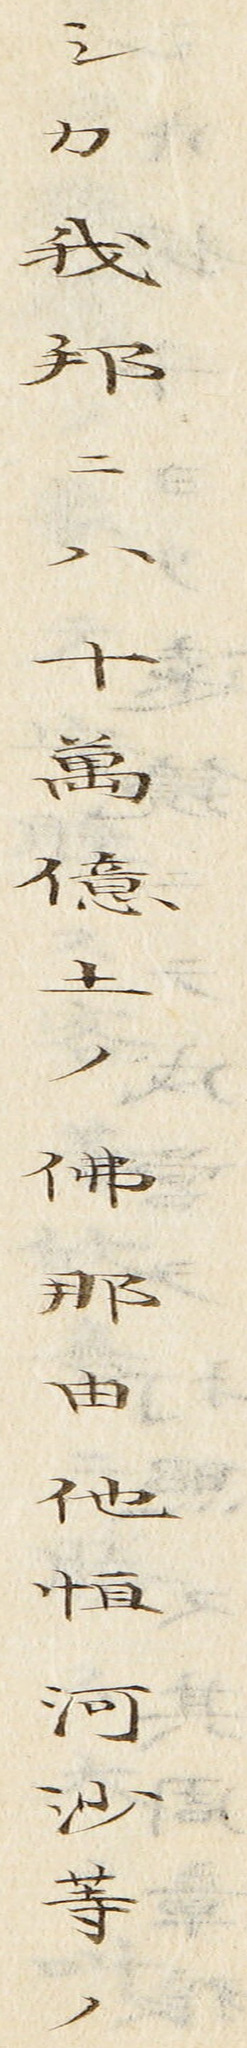シカ我邦ニハ十萬億土ノ佛那由他恒河沙等ノ
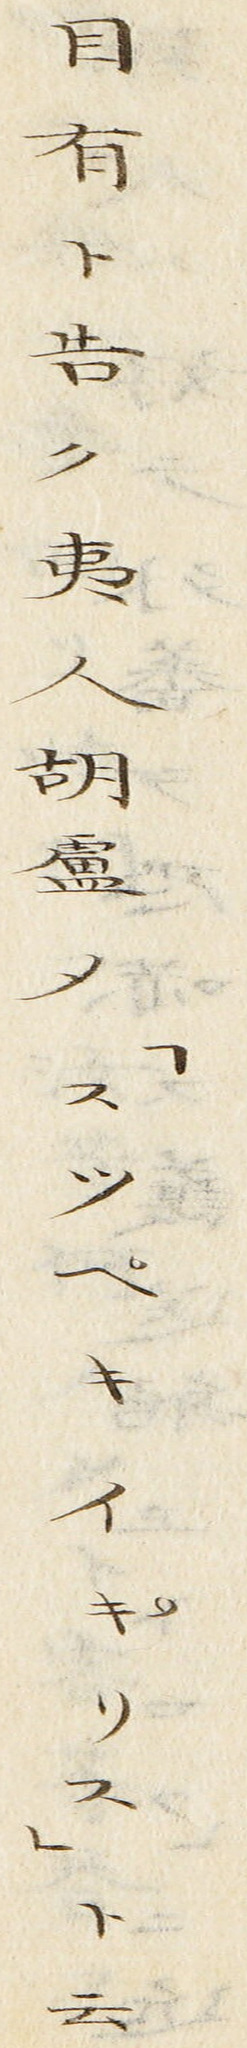目有ト告ク夷人胡盧シテ「スツペキイリス」ト云
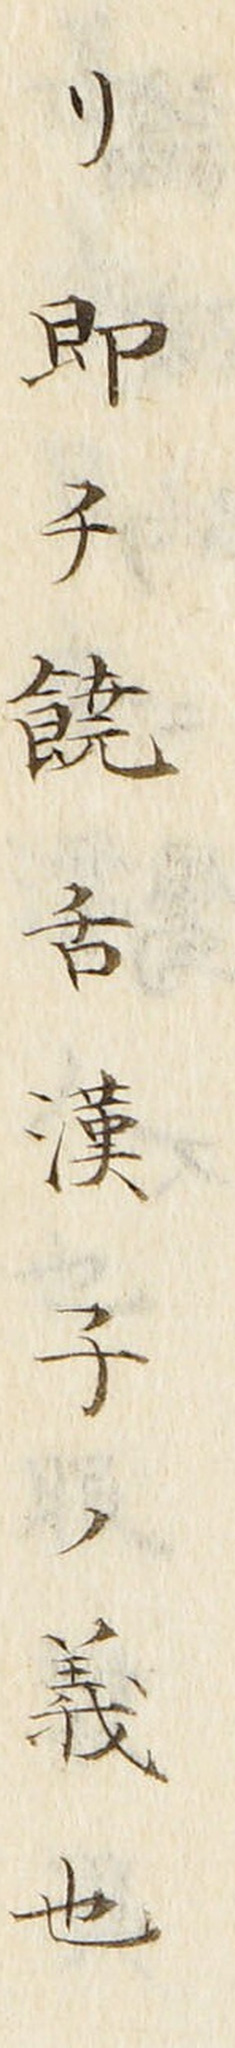リ即チ饒舌漢子ノ義也
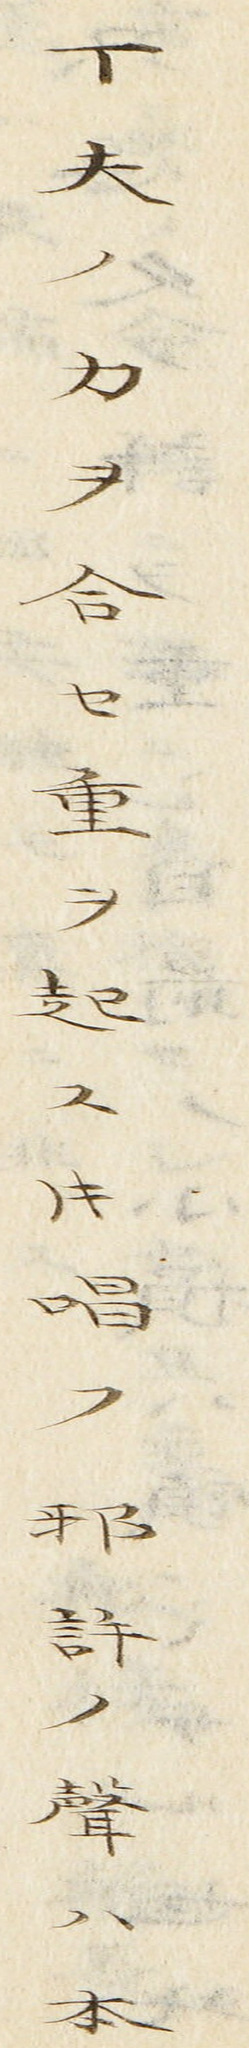〇丁夫ノ力ヲ合セ重ヲ起ストキ唱フ邪許ノ聲ハ本
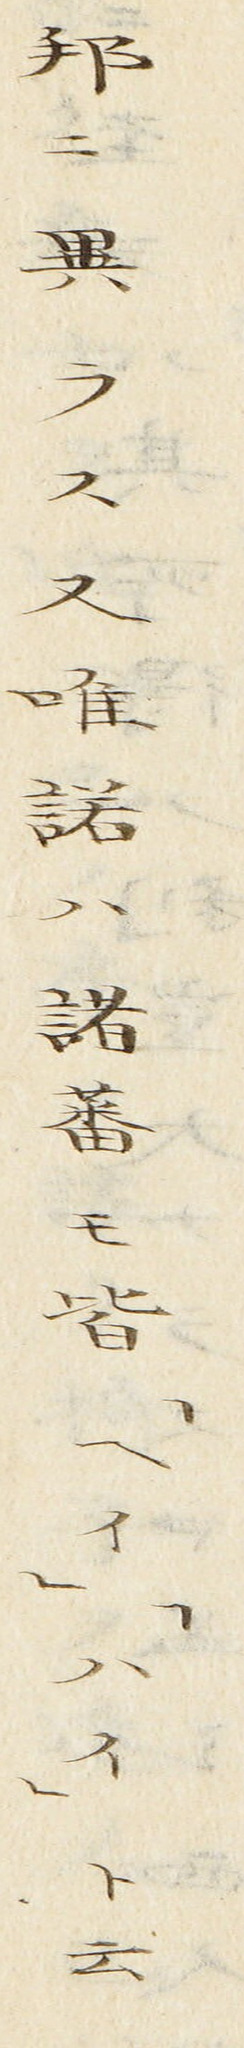邦ニ異ラス又唯諾ハ諸蕃モ皆「ヘイ」「ハイ」ト云
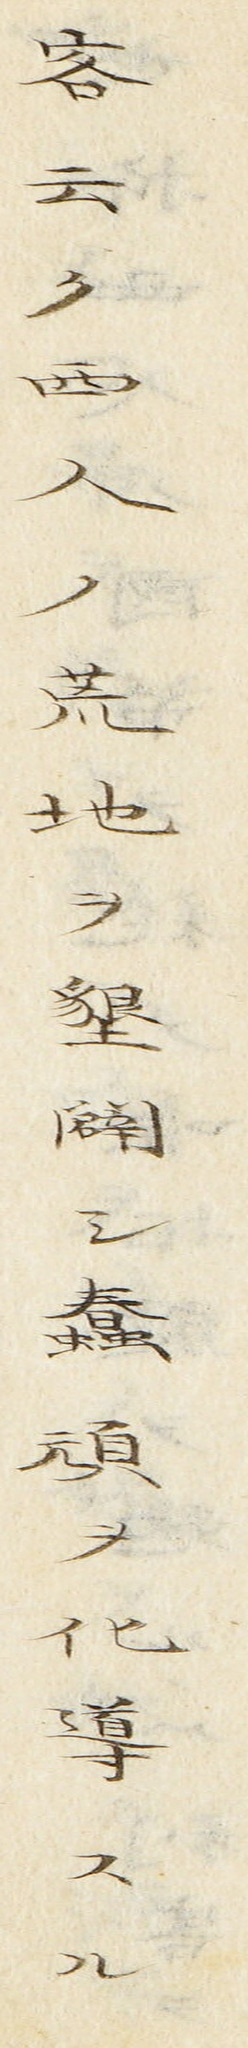〇客云ク西人ノ荒地ヲ墾闢シ蠢頑ヲ化導スル
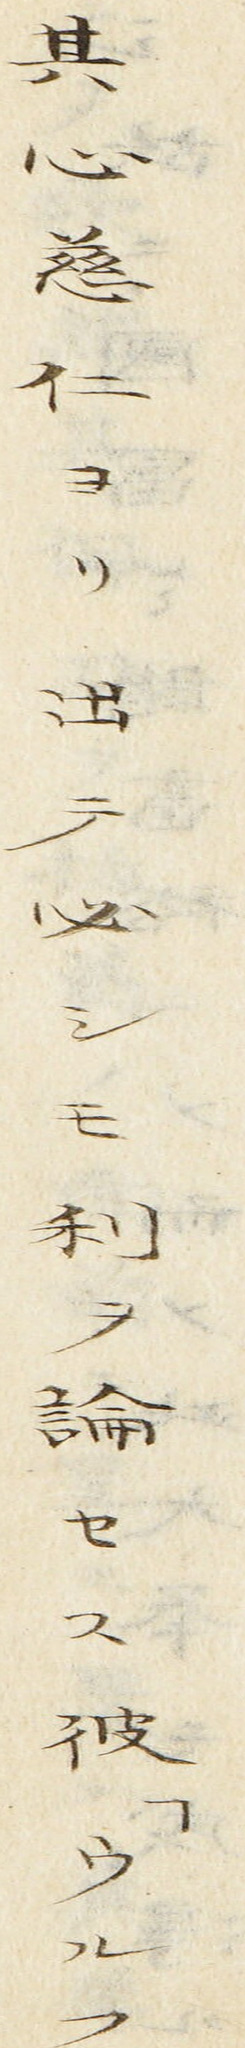其心慈仁ヨリ出テ必シモ利ヲ論セス彼「ウルフ
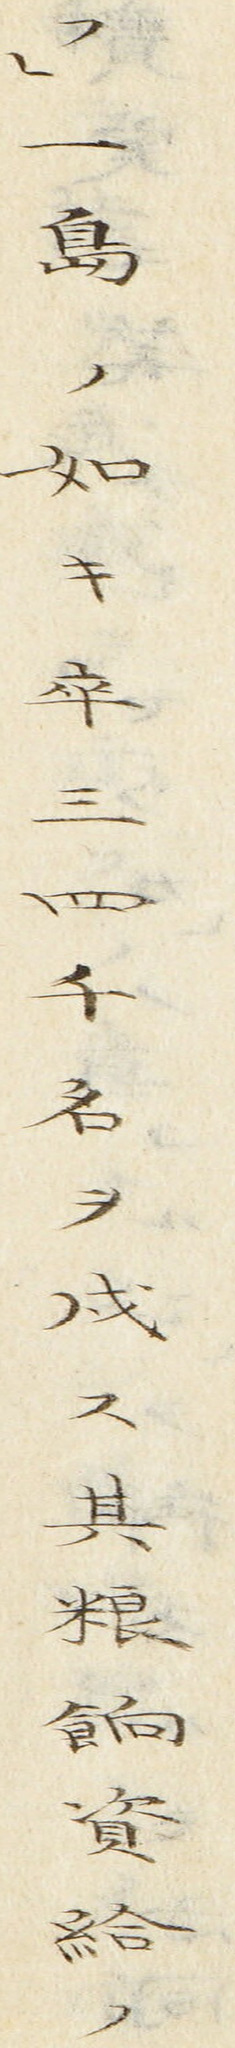フ」一島ノ如キ卒三四千名ヲ戌ス其粮餉資給ノ
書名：蕃談
